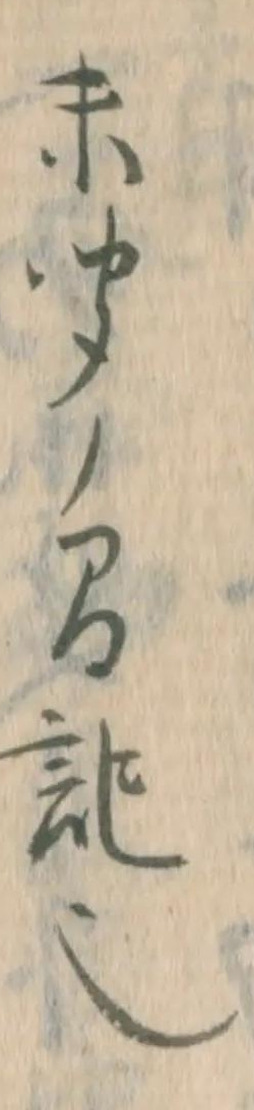未聞ノ間記也
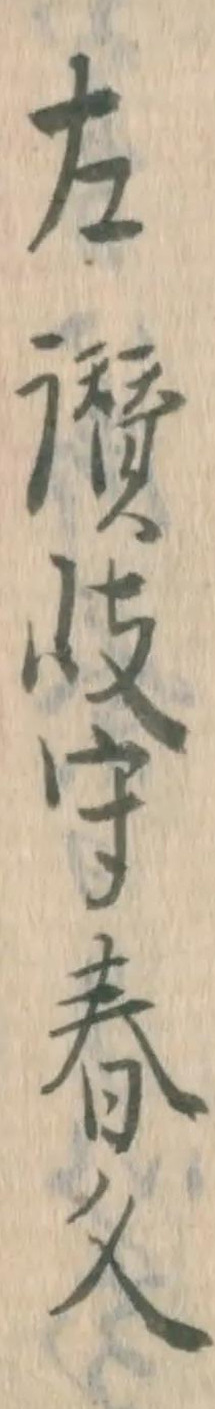左讃岐守春久
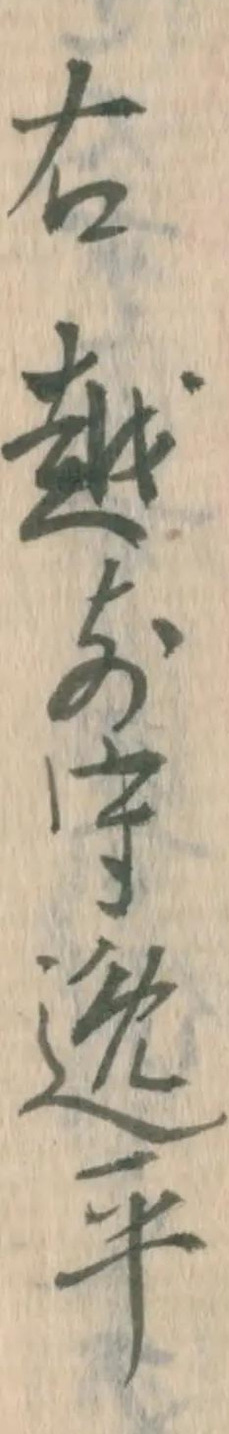右越前守逸平
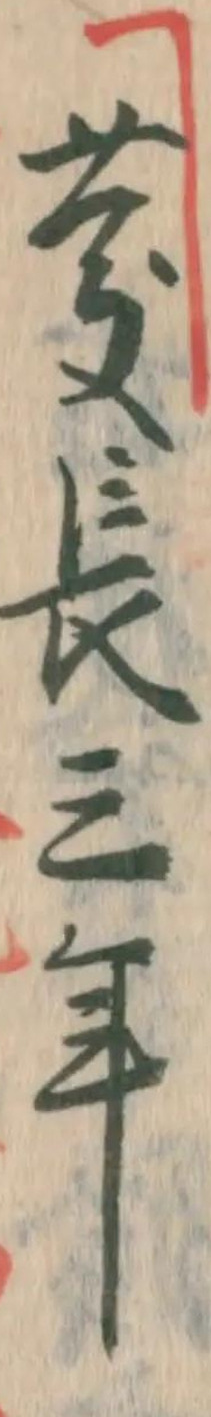慶長三年
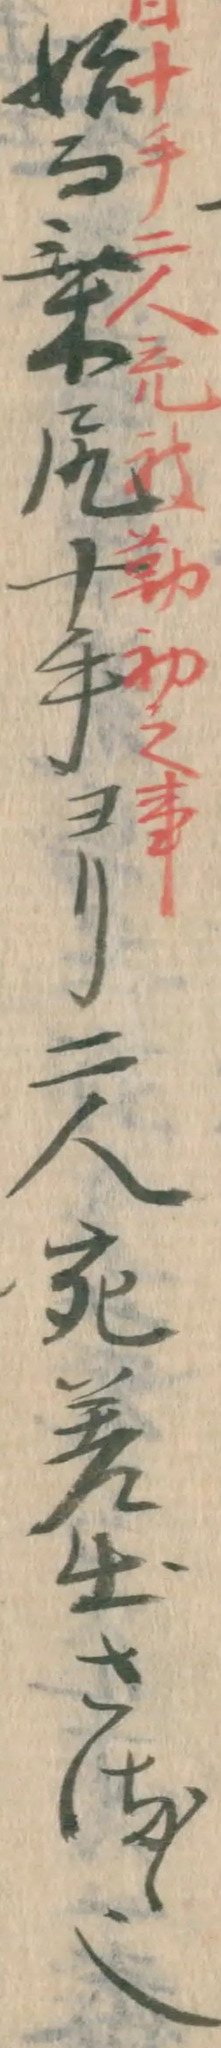始而乗尻十手ヨリ二人宛差出さるゝ也
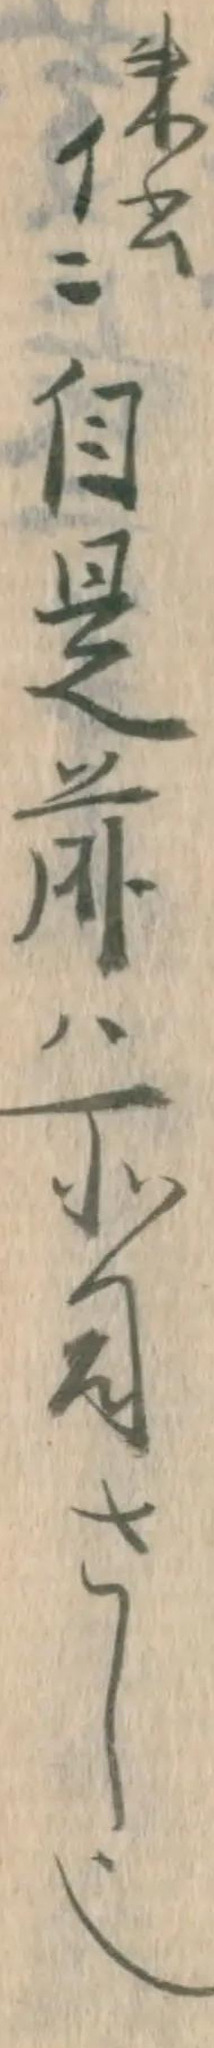イニ自是前ハ所司さし也
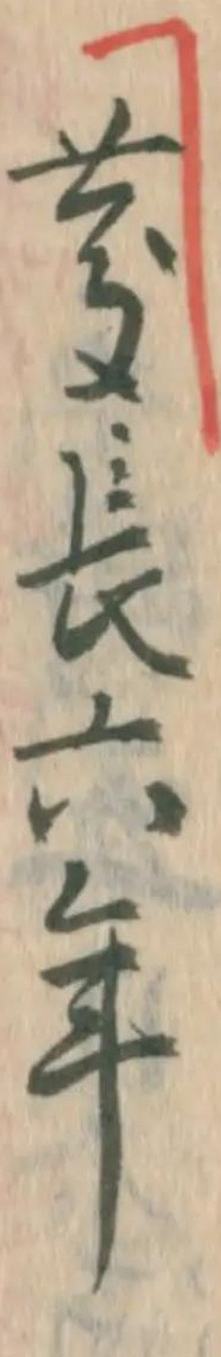慶長六年
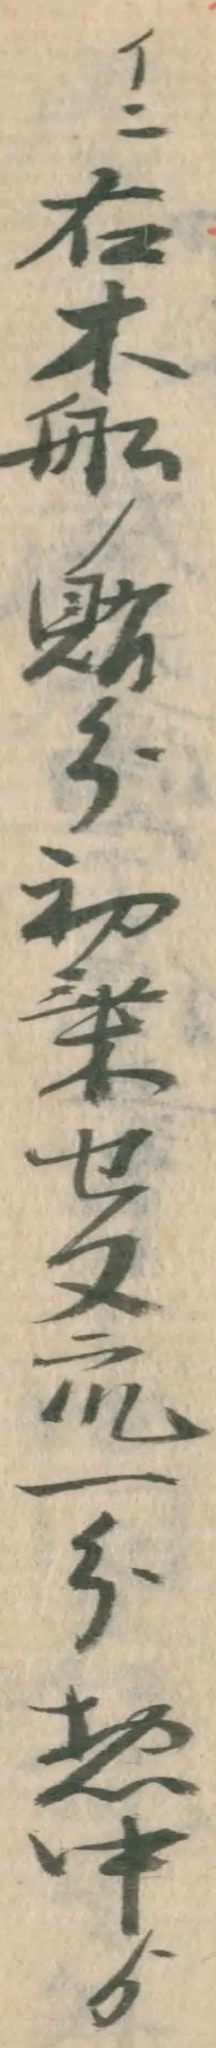イニ右木船ノ賄分初乗せ又衆一分惣中ゟ
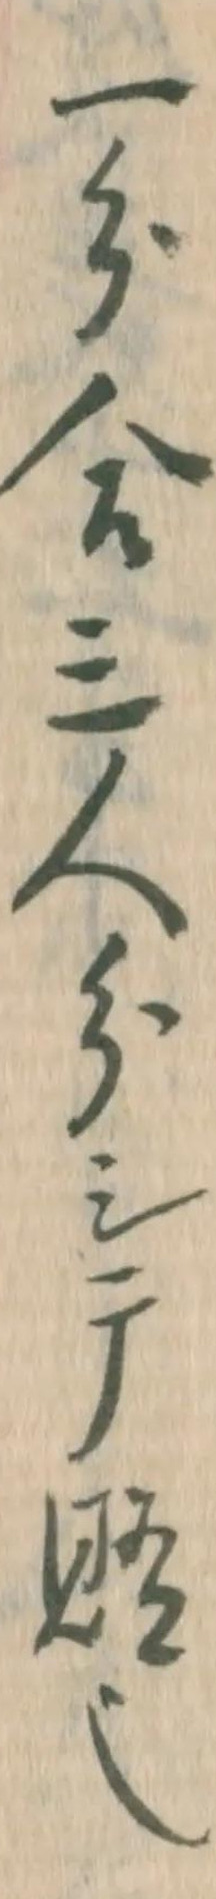一分合三人分シテ賄也
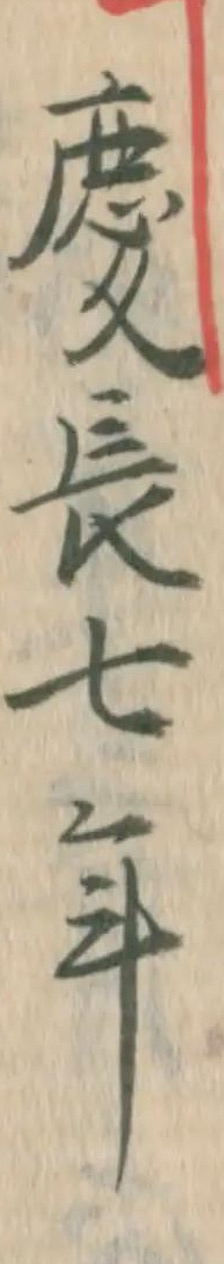慶長七年
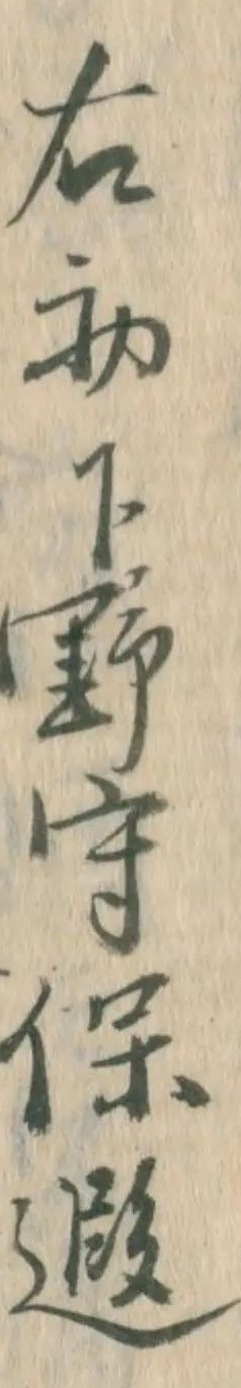右初下野守保遐
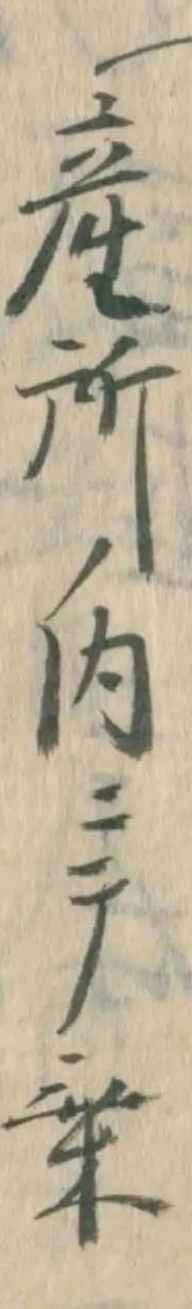(産所ノ内ニテ乗

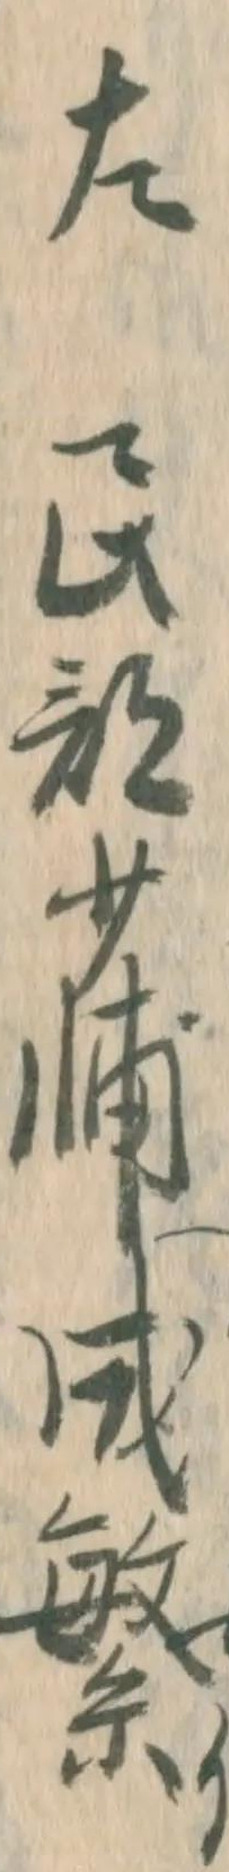左民部少輔・成繁
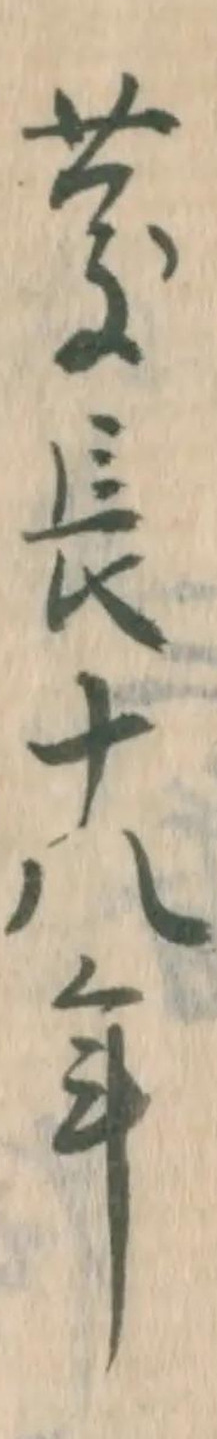慶長十八年
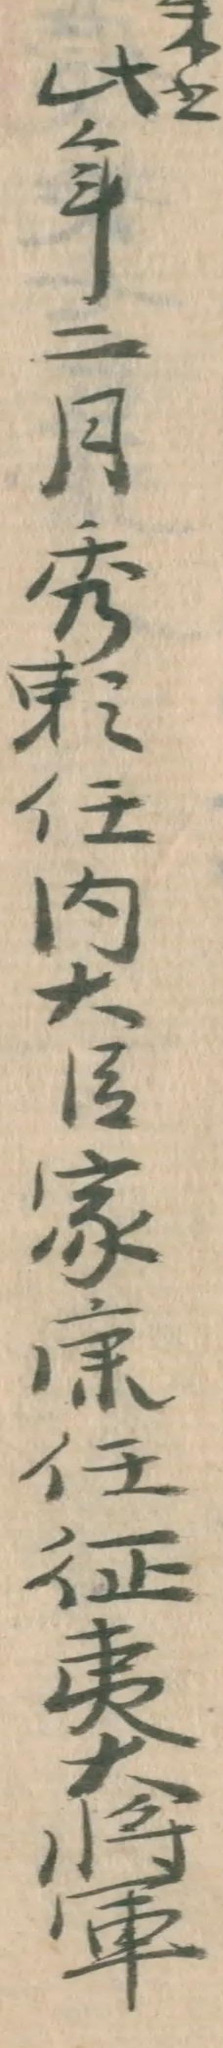此年二月秀頼任内大臣家康任征夷大将軍
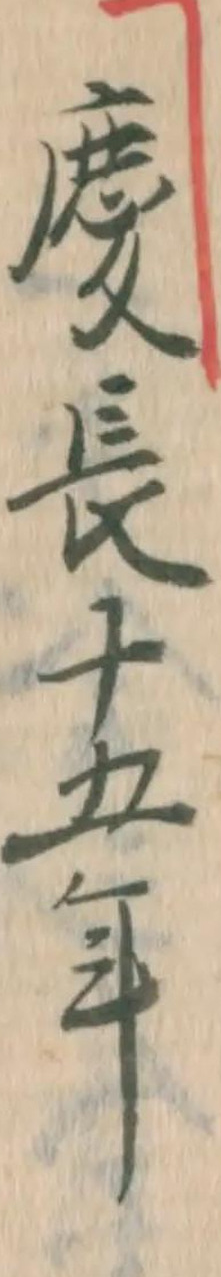慶長十五年
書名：賀茂社記録. 第10冊
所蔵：国立国会図書館 National Diet Library, JAPAN
